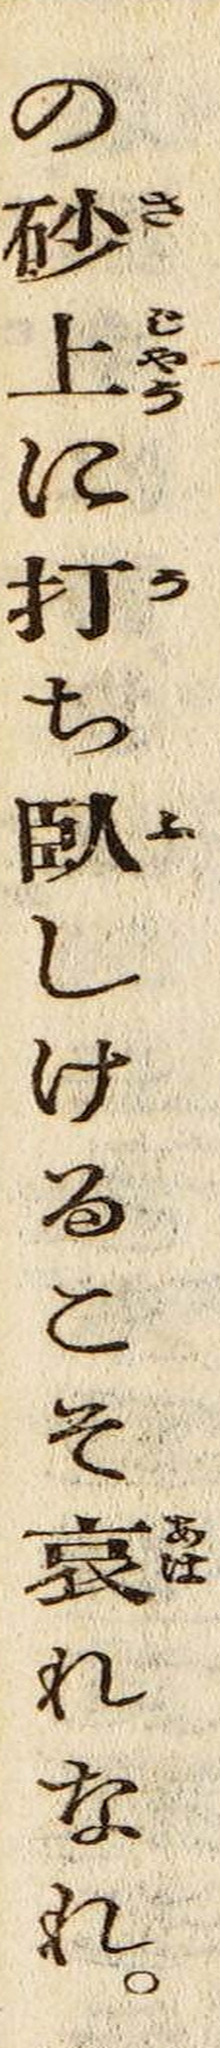の砂上に打ち臥しけるこそ哀れなれ。
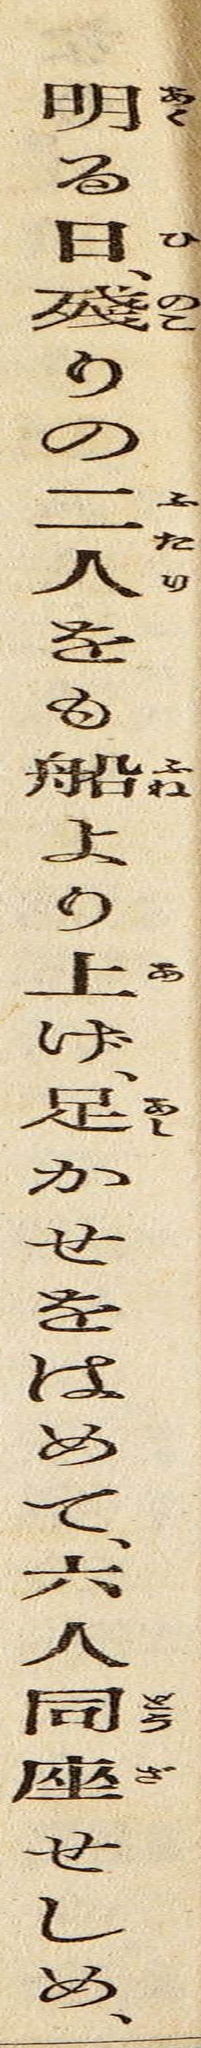明る日、残りの二人をも船より上げ、足かせをはめて、六人同座せしめ、
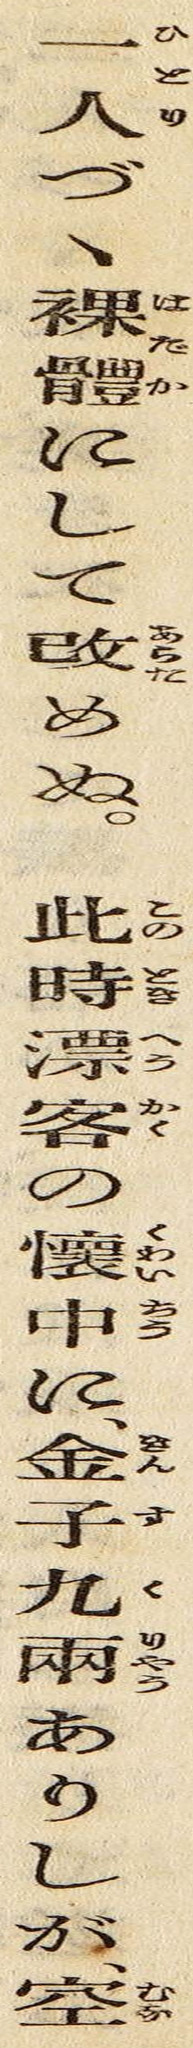一人づヽ裸体にして改めぬ。此時漂客の懐中に、金子九両ありしが、空
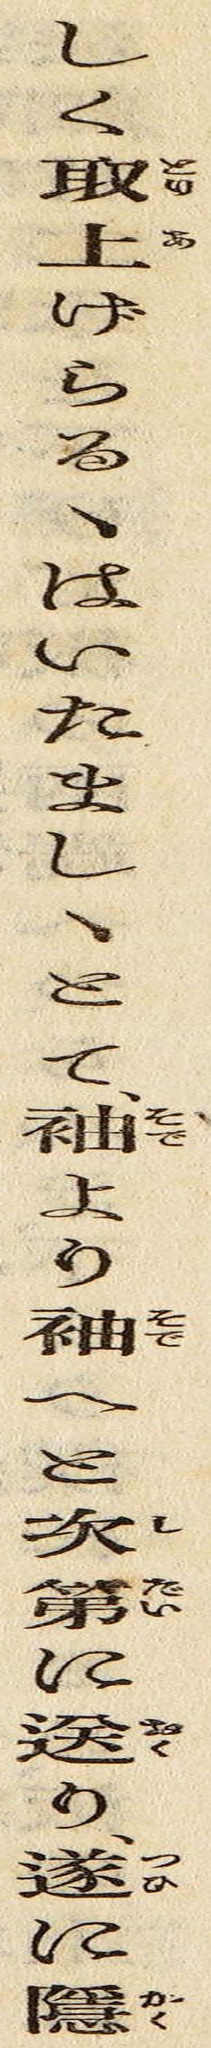しく取上げらるヽはいたましヽとて、袖より袖へと次第に送り、遂に隠
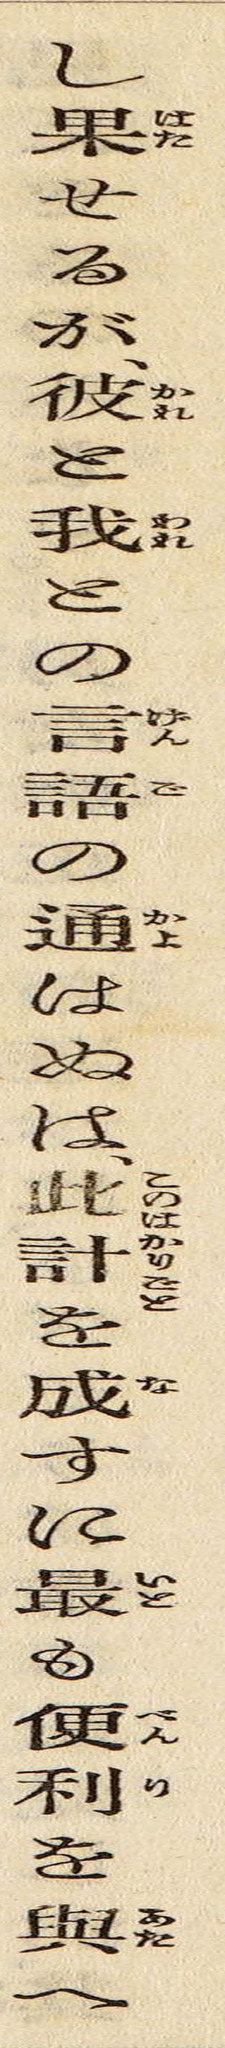し果せるが、彼と我との言語の通はぬは、此計を成すに最も便利を与へ
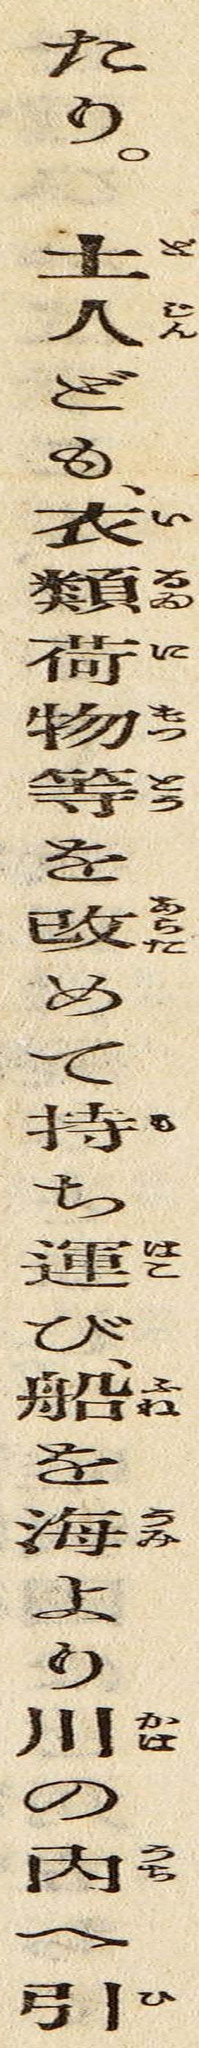たり。土人ども、衣類荷物等を改めて持ち運び、船を海より川の内へ引
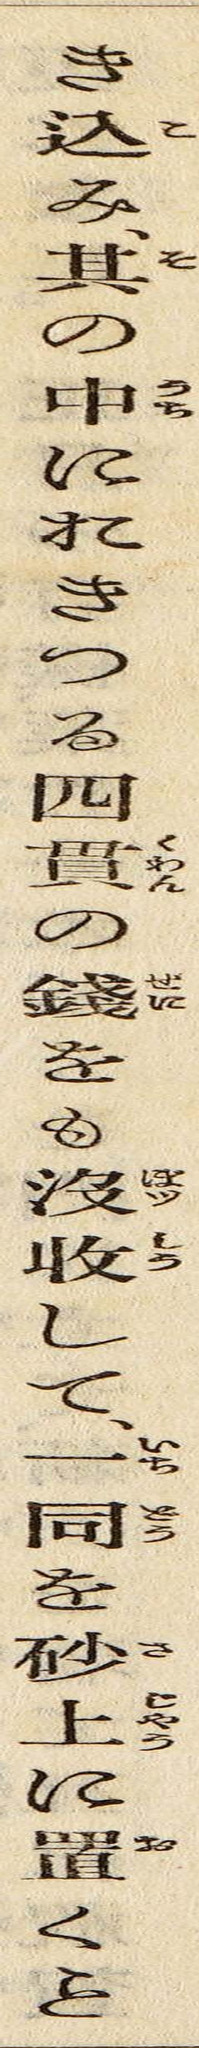き込み、其の中におきつる四貫の銭をも没収して、一同を砂上に置くこと
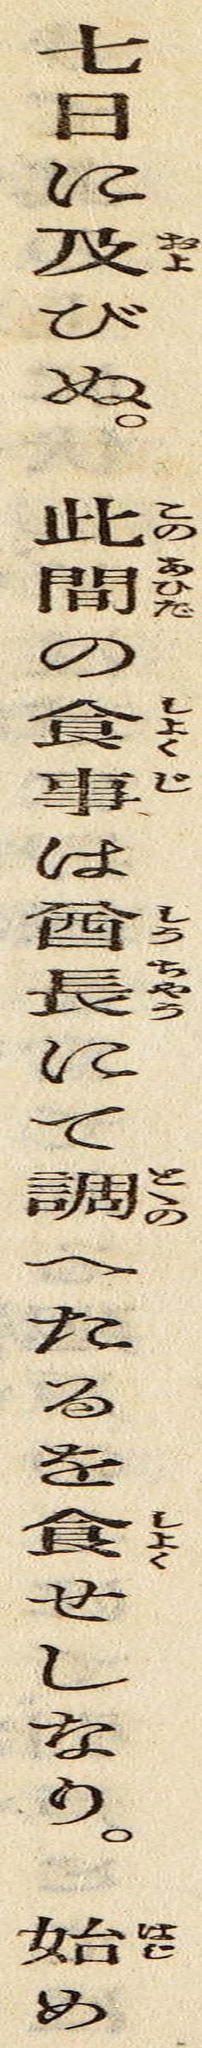七日に及びぬ。此間の食事は酋長にて調へたるを食せしなり。始め
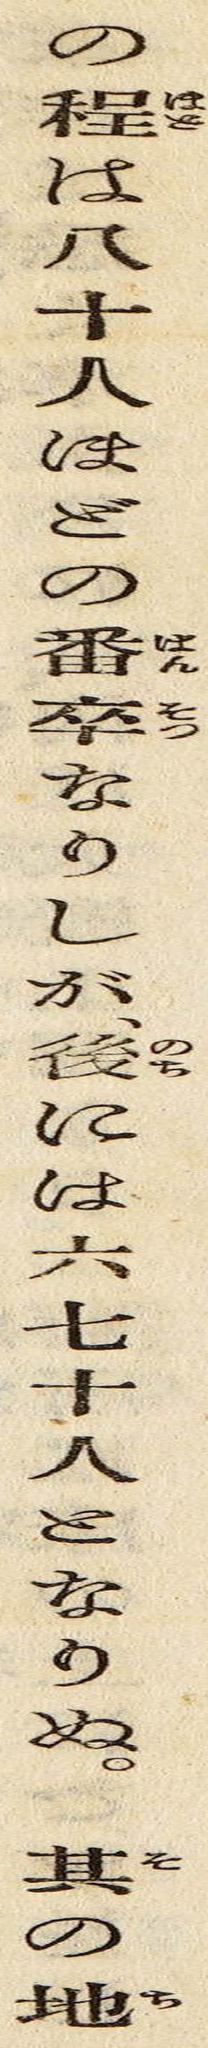の程は八十人ほどの番卒なりしが、後には六七十人となりぬ。其の地
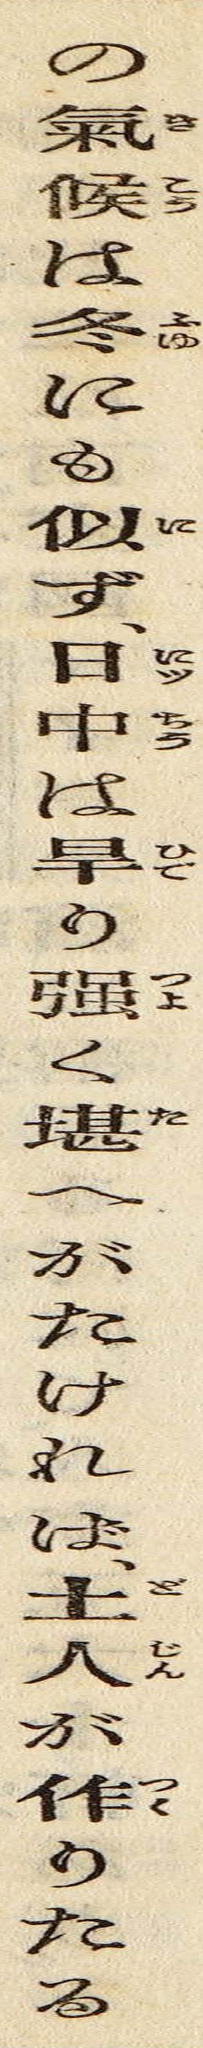の気候は冬にも似ず、日中は旱り強く堪へがたければ、土人が作りたる
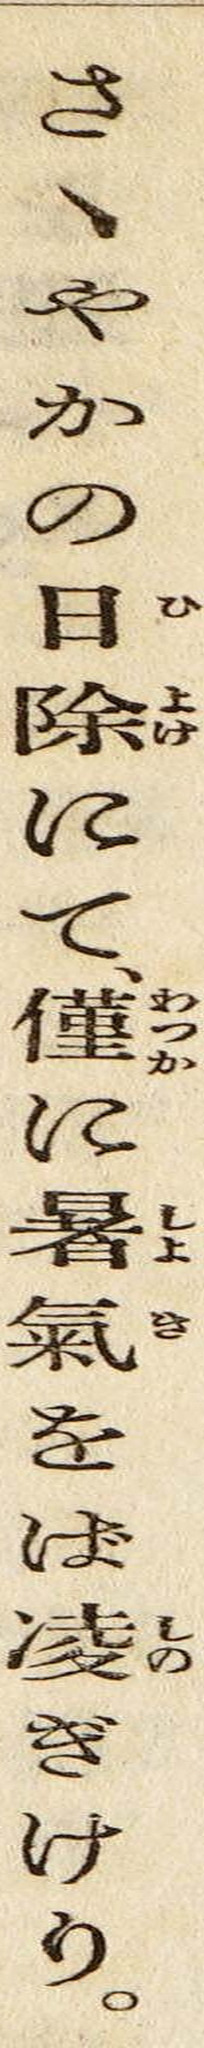さヽやかの日除にて、僅に暑気をば凌ぎけり。
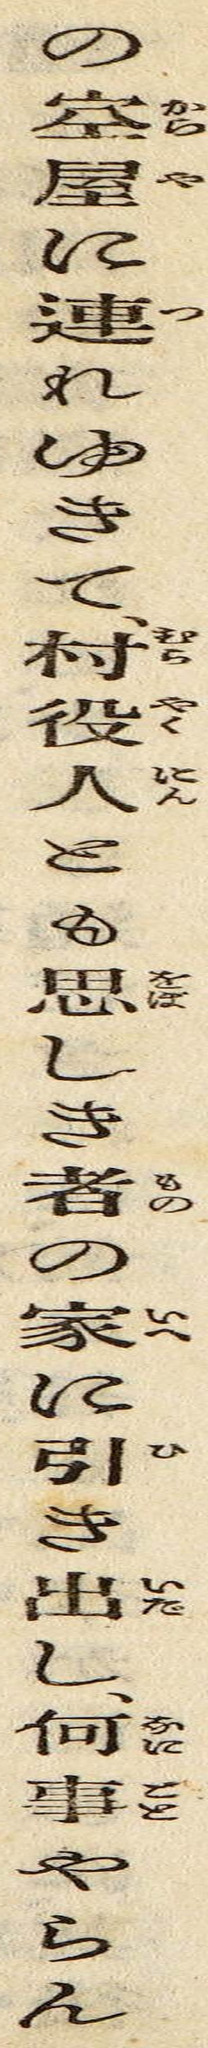の空屋に連れゆきて、村役人とも思しき者の家に引き出し、何事やらん

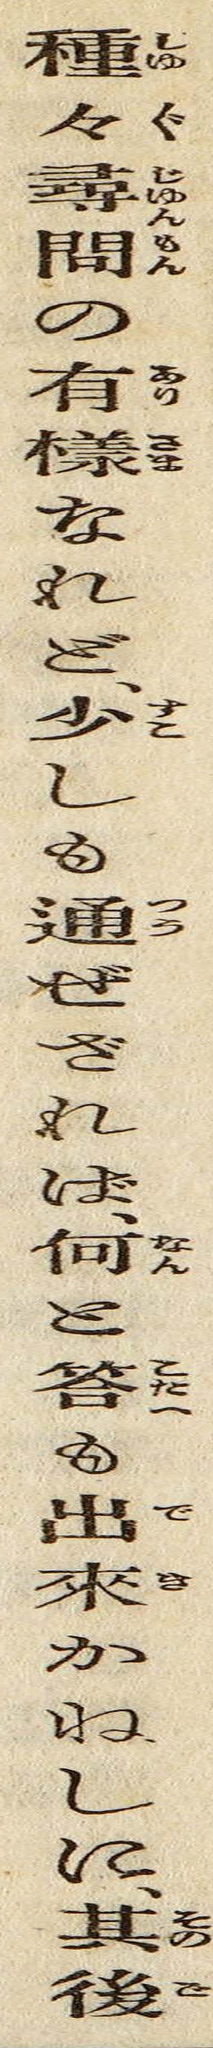種々尋問の有様なれど、少しも通ぜざれば、何と答も出来かねしに、其後
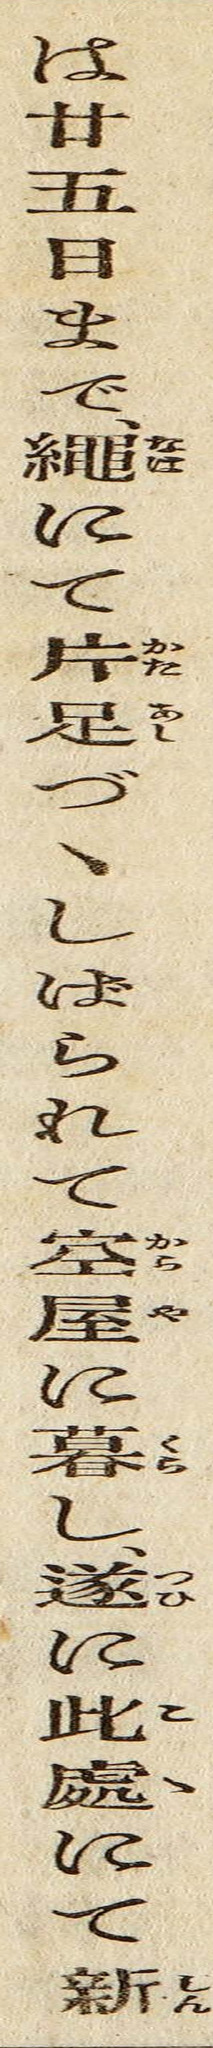は廿五日まで、縄にて片足づヽしばられて空屋に暮し、遂に此処にて新
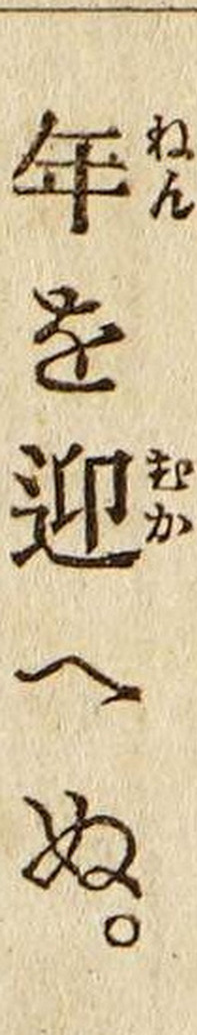年を迎へぬ。
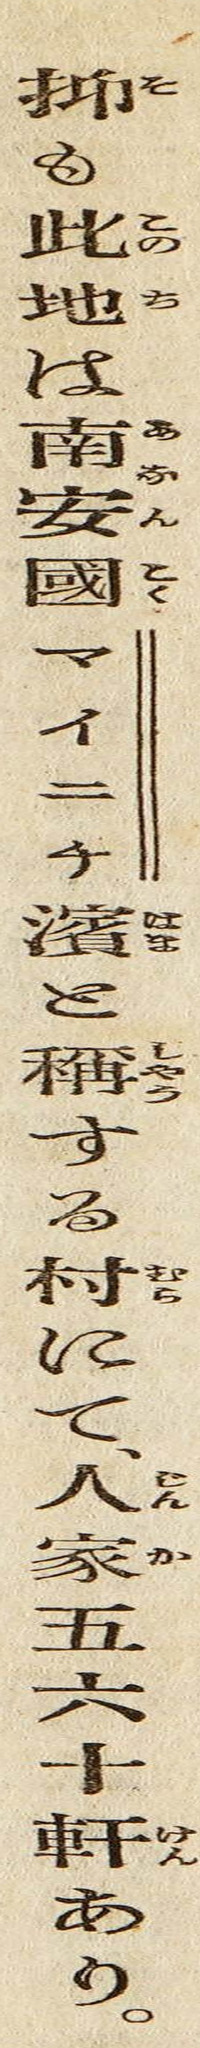抑も此地は南安国マイニチ浜と称する村にて、人家五六十軒あり。
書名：日本漂流譚
